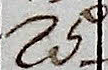25
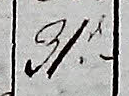31.
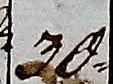30
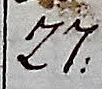27
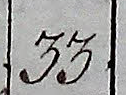33
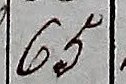65
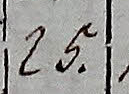25.
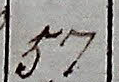57
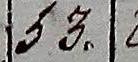53.
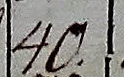40.
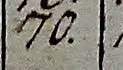70.
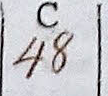48
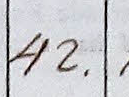42.
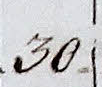30
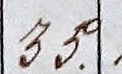35.
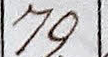79.
